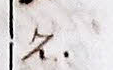2.
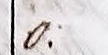0.
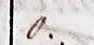0.
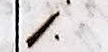1.
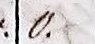0.
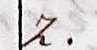2.
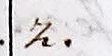2.
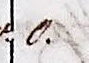0.
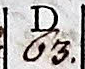63.
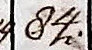84
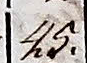45.
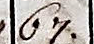67.
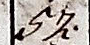52.
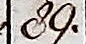89.
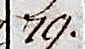79.
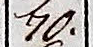70.
